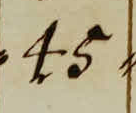45
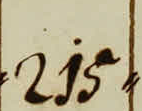215
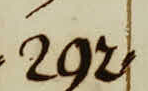292
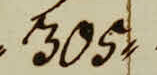305
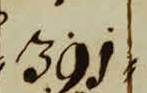391
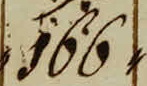166
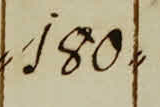180
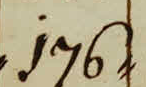176
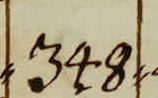348
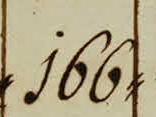166
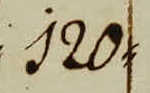120
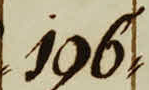196
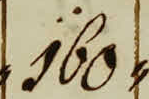160
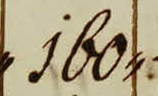160
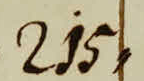215
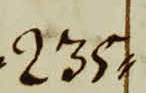235
